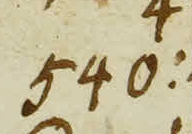540
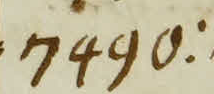7490
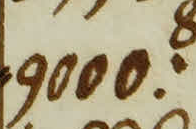9000.
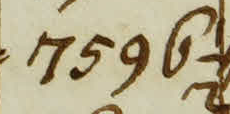7596
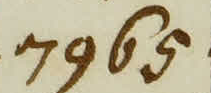7965
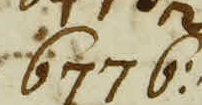6776
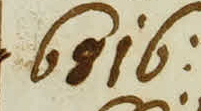6816
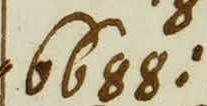6688
